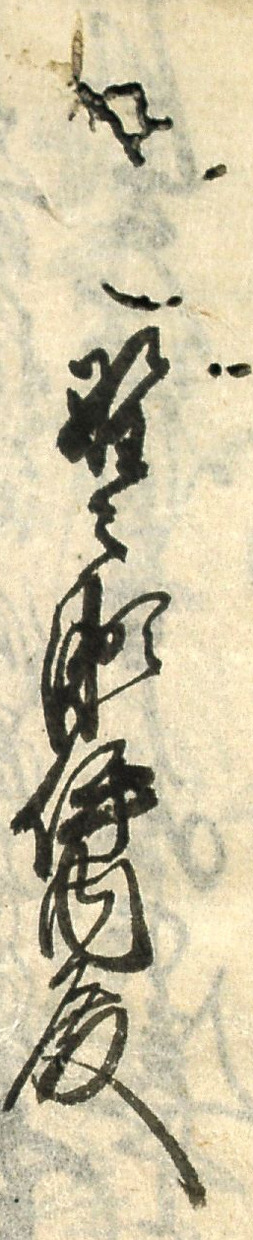野々瀬伴内殿
